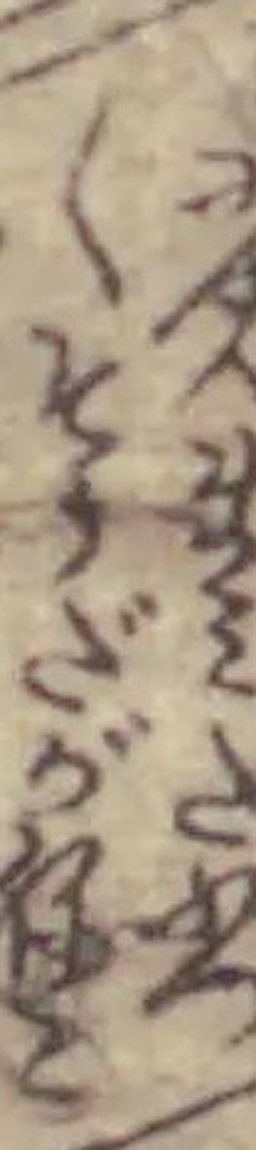〳〵そうだがねこ
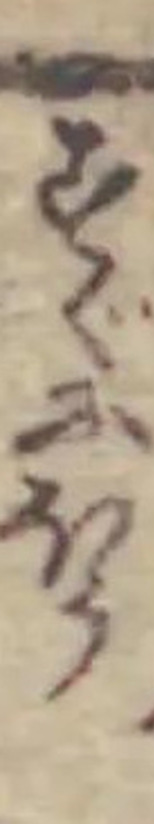すぐにほう
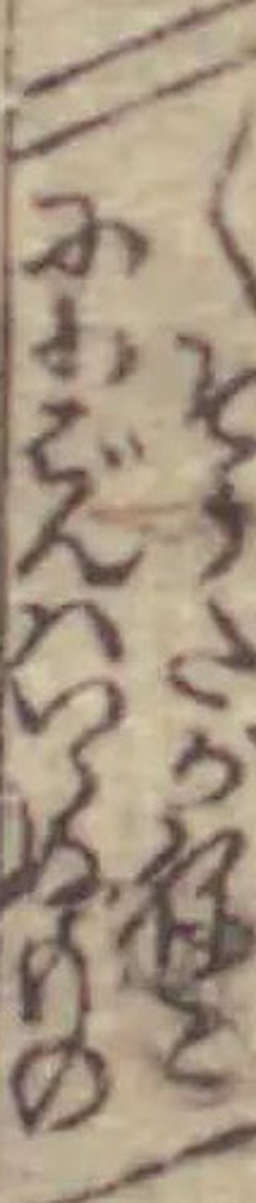に小ばんはいらぬもの
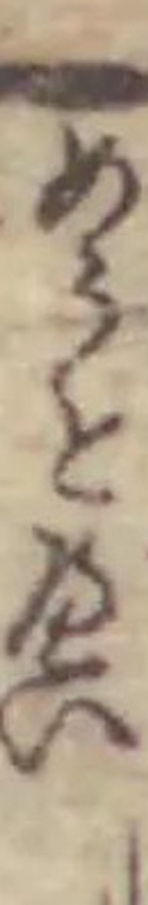めうをへい
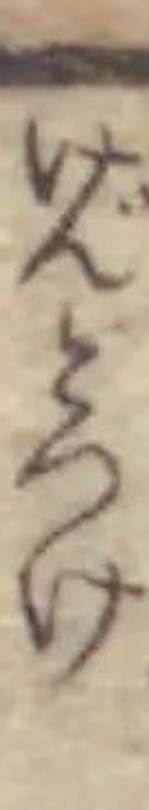げんとつけ
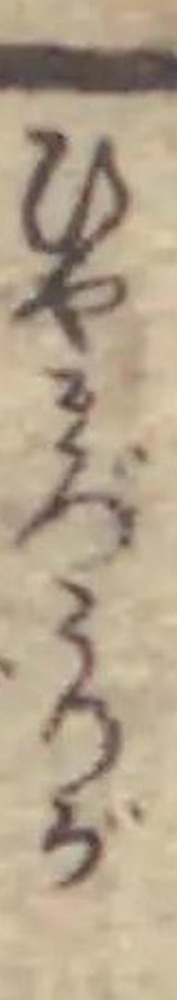ひやみづうりが
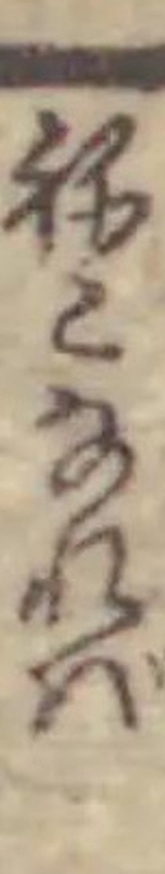ねこなれば
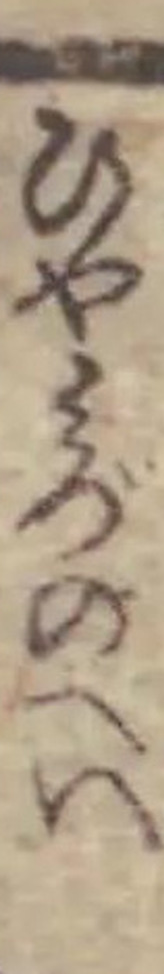ひやみづのへい
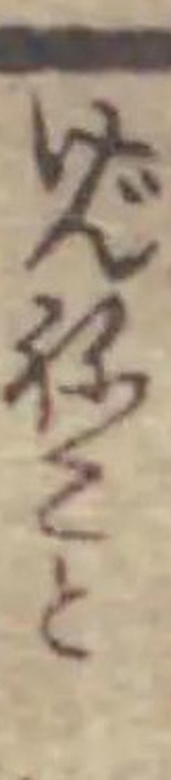げんねこと
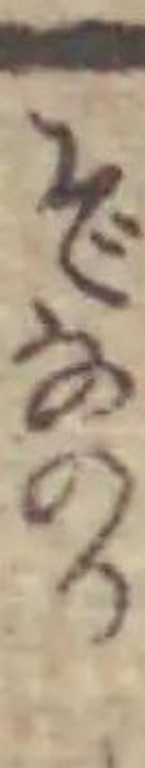ぞなのり

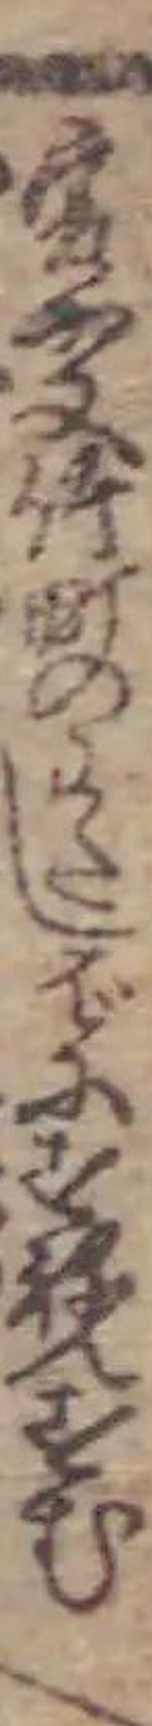爰に又竹町のわたしばにすねんすむ
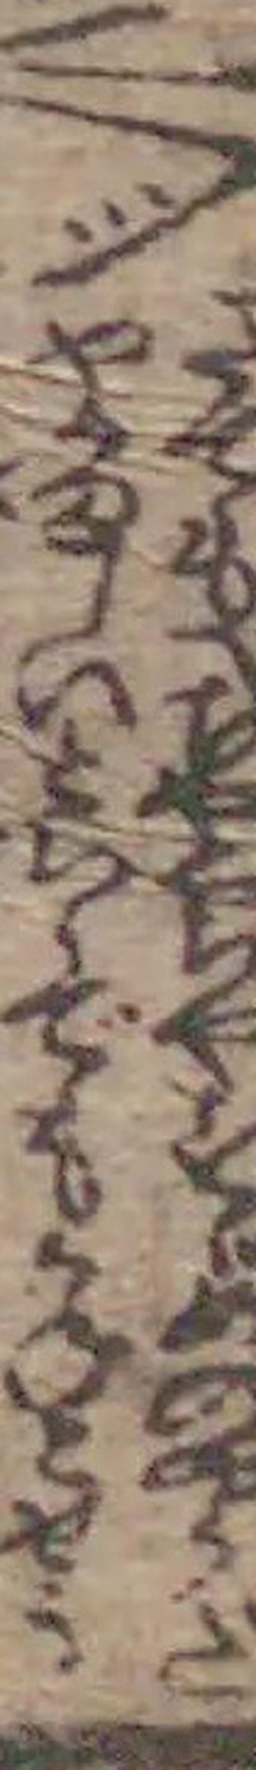やかましいとちらでもかねとせう
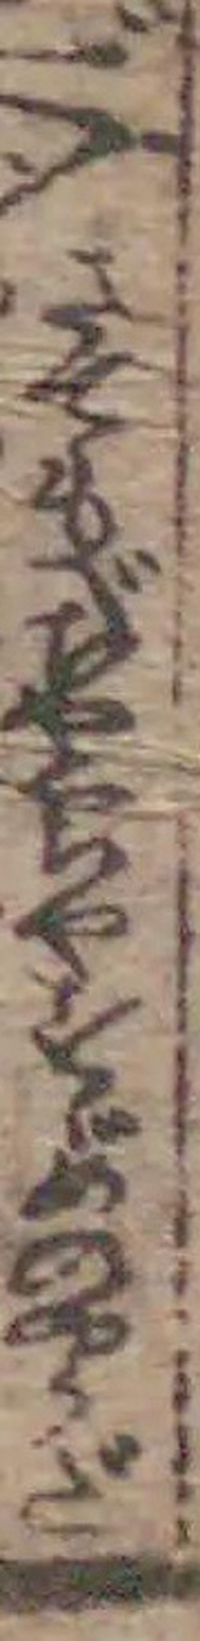さてもべちやくちやすゞめのやうだ
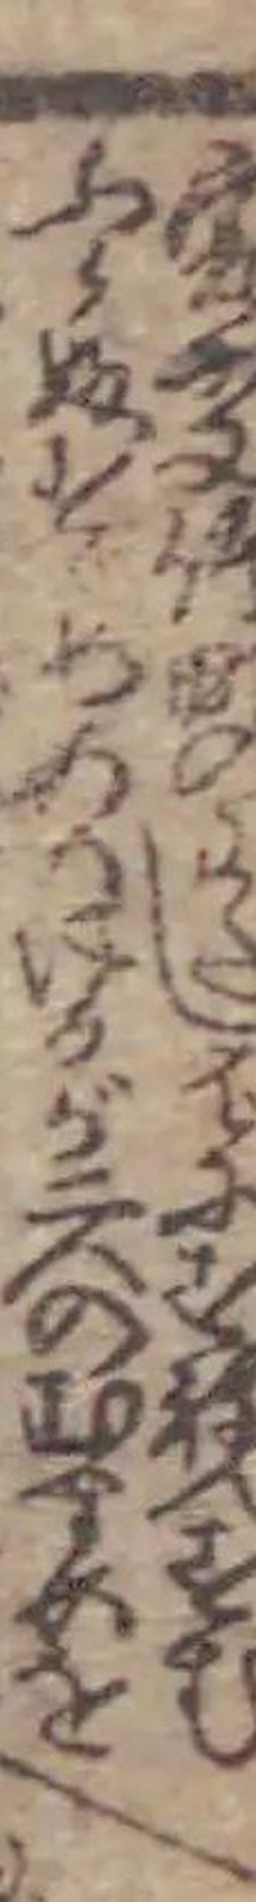ふうふすゞめありけるが二人のむすめを
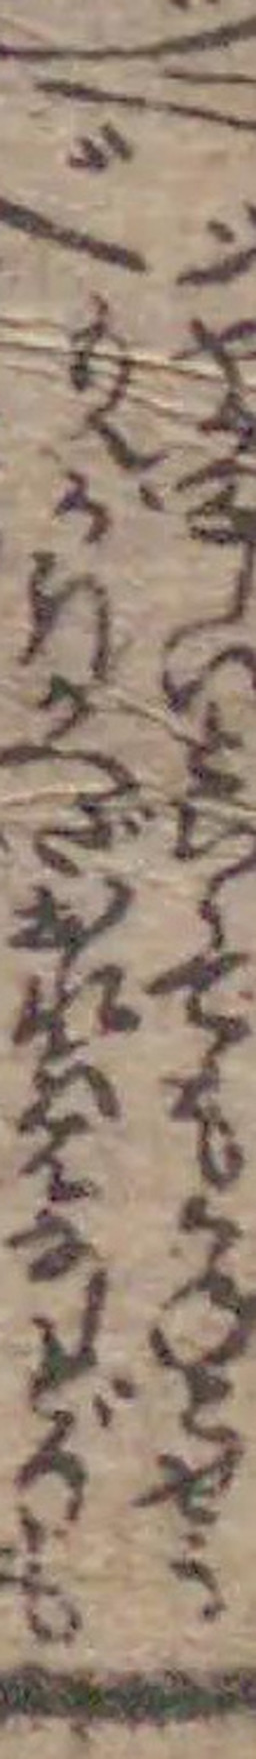もんが引かへだおれははなしどりも
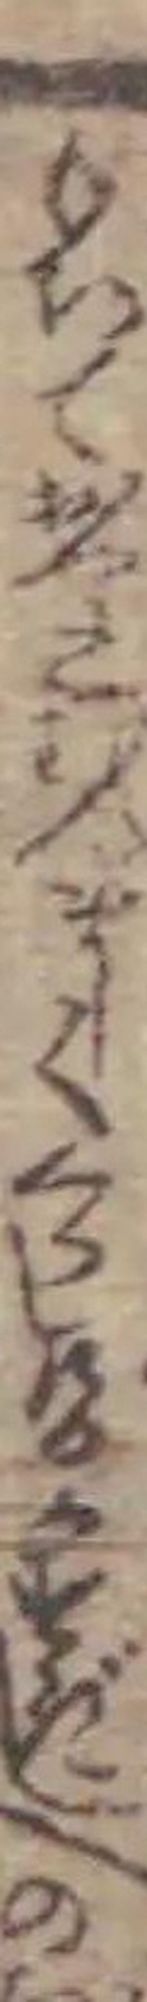もちておやこむつましくくらしけるかすぎし
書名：冷水灰毛猫 2巻
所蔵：国立国会図書館 National Diet Library, JAPAN
